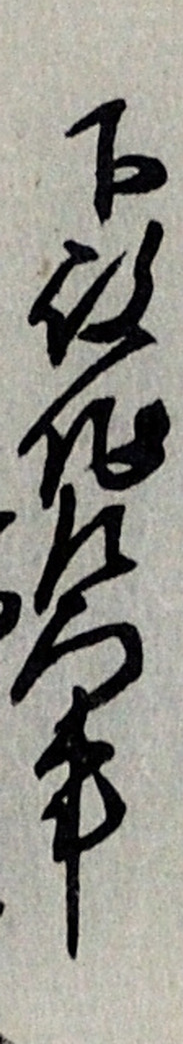下役作左衛門事
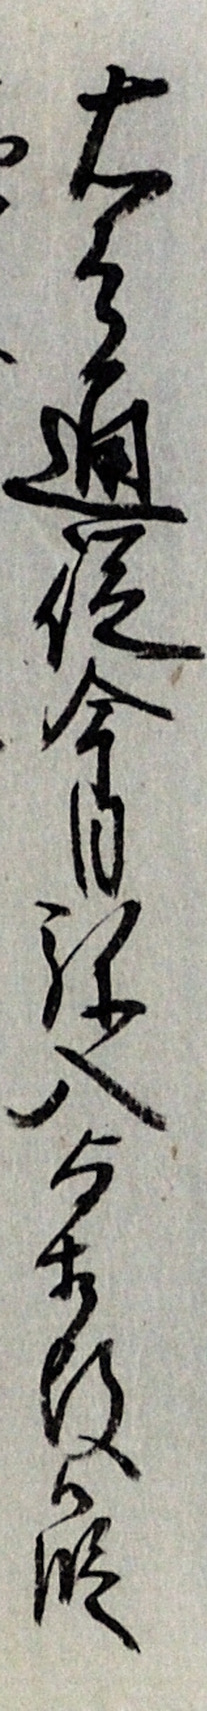右之通従今日弥八与相改候段
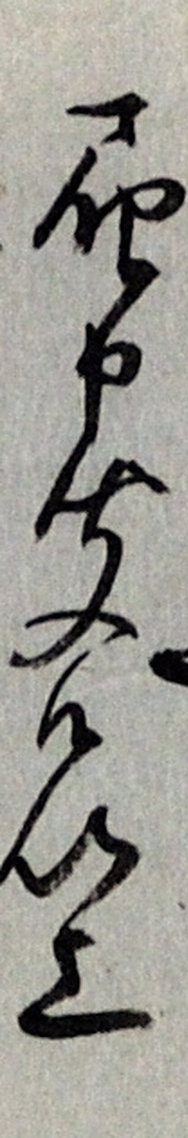届申聞候以上
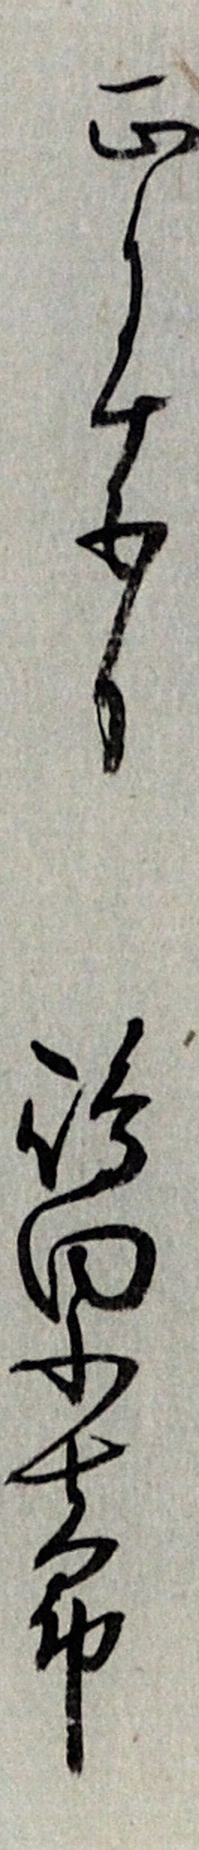正月十五日嶋田小十郎
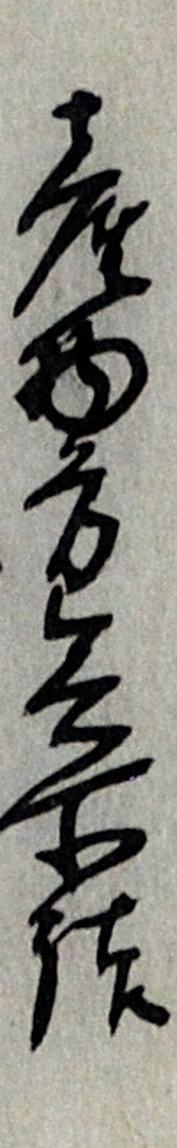産物方会所詰
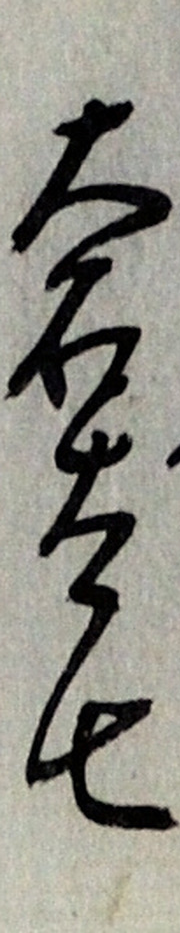大石太七
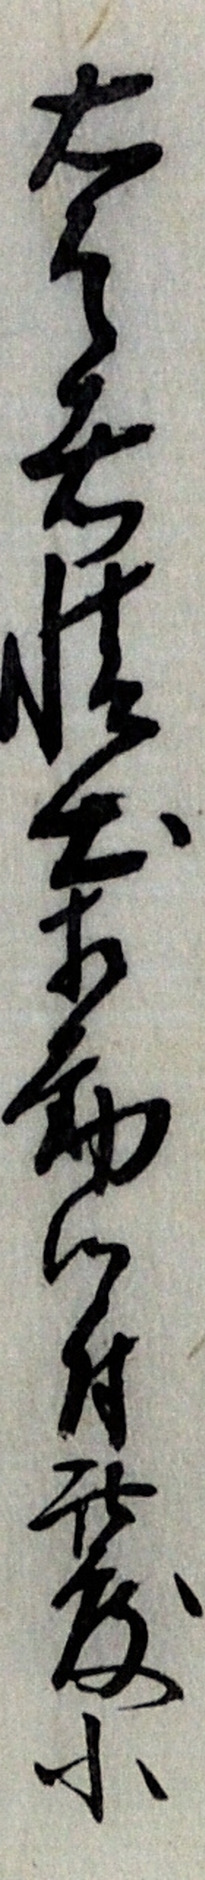右之者情出相勤候付此度小
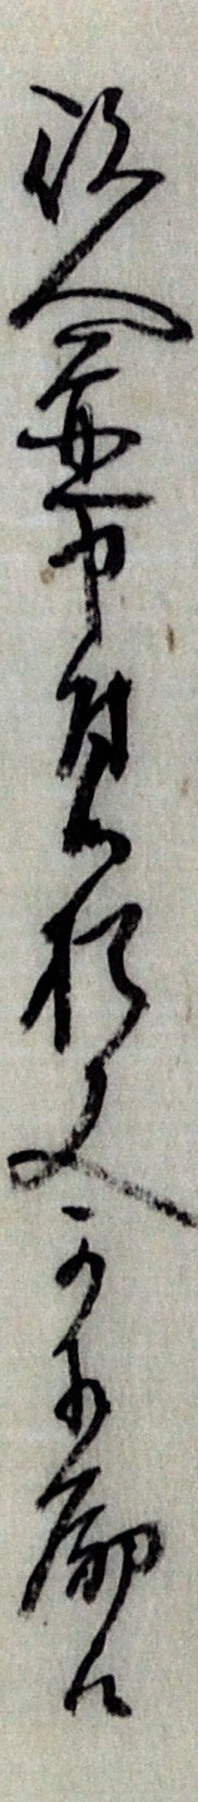役人並申付候猶又可相励候

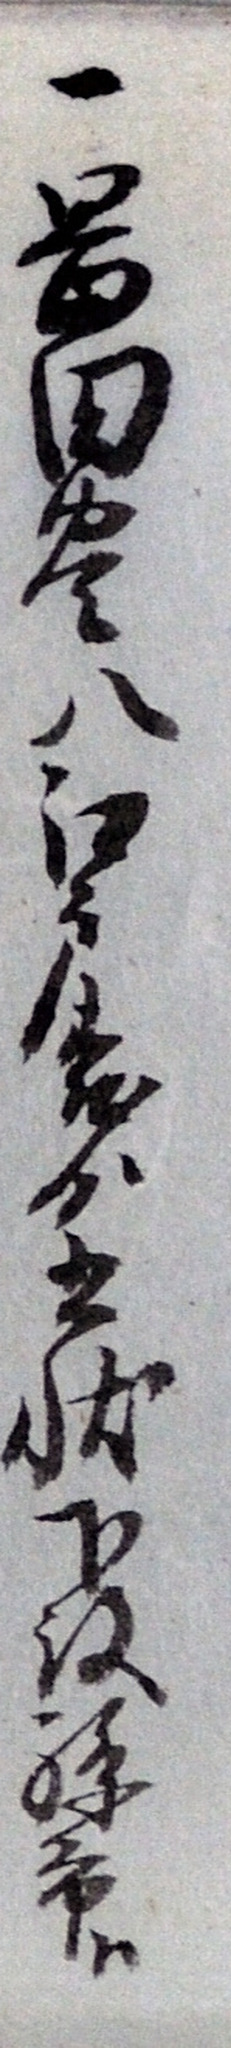一岡田豊八江戸表ゟ書状下役孫市江
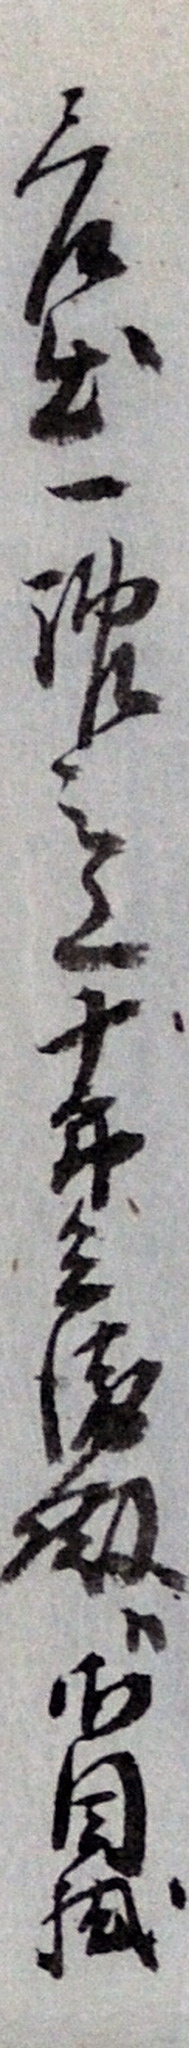差出一覧之上十郎兵衛江御目掛
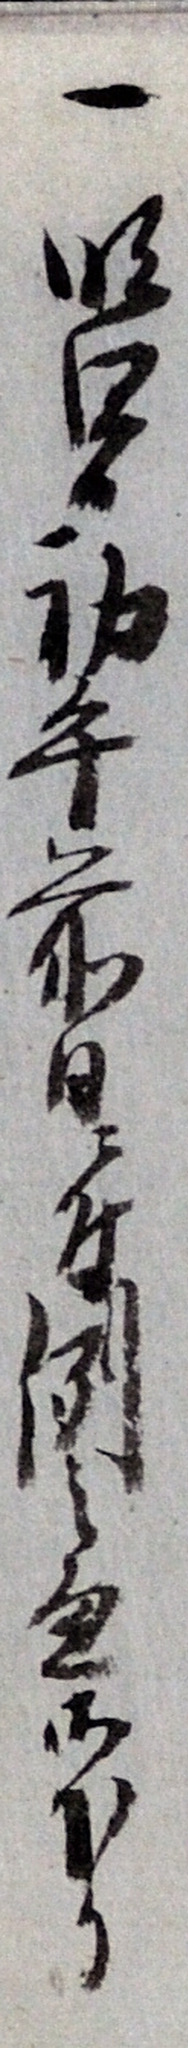一明日初午前日ニ付例之通御下り
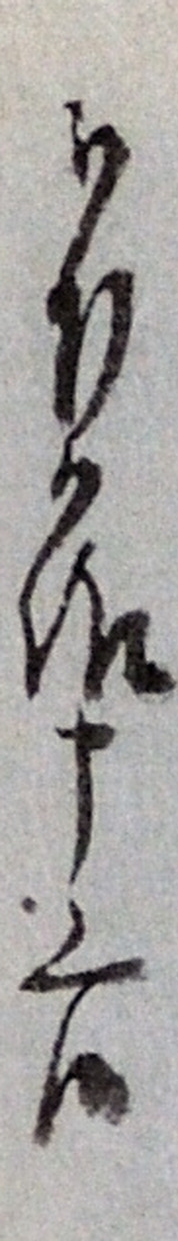被下候様申上候
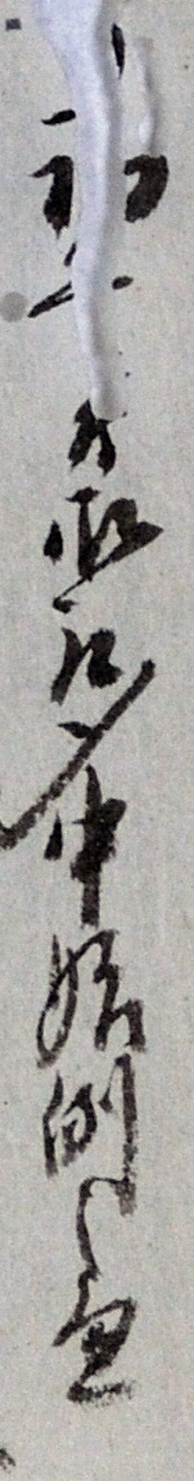初午付御取〆中始例之通
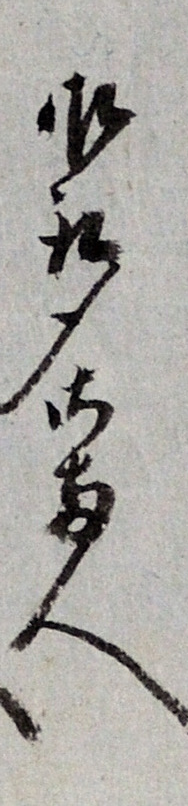御取〆御両人
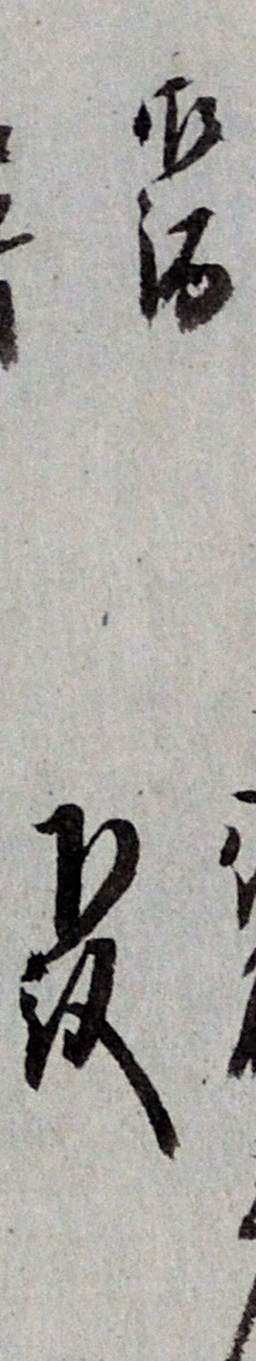御酒下役
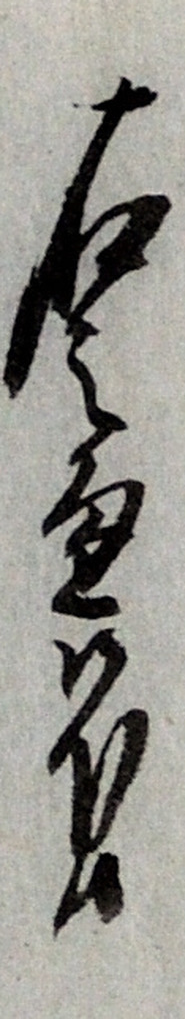右之通御下候
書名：諸事御用留
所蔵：伊那市立高遠町図書館・合同会社AMANE
